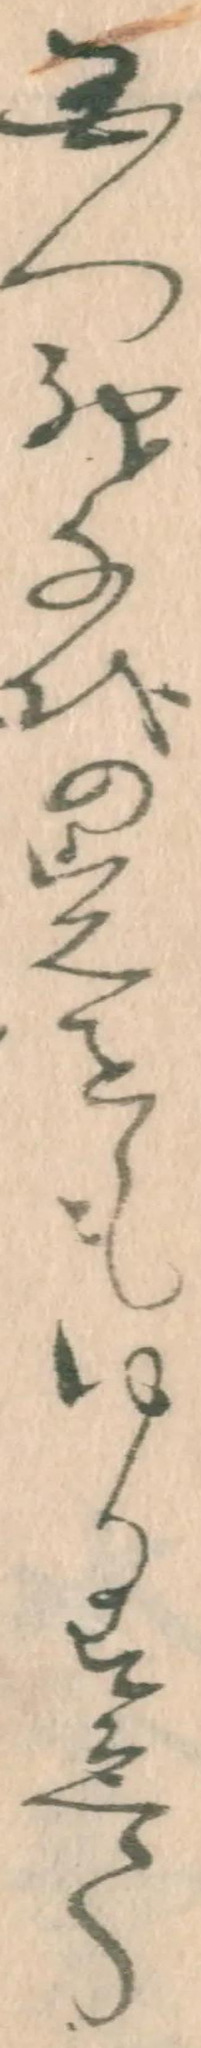国つ神千代の岩をもゆりすゑて
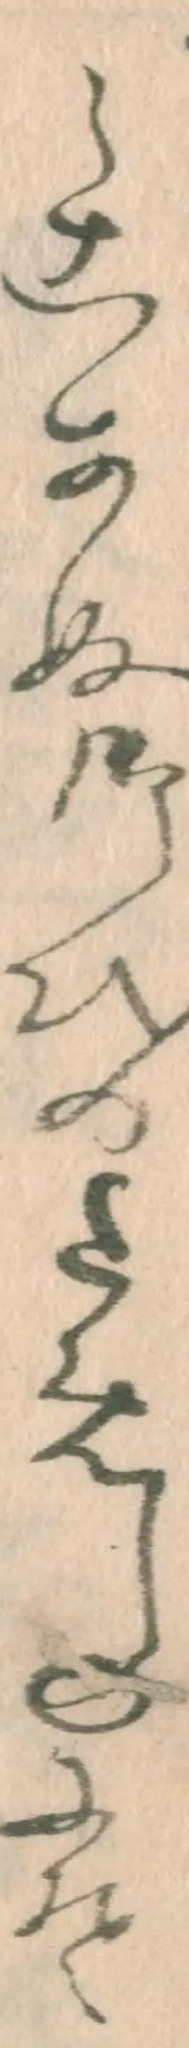うこかぬ御代のためし○にそ引
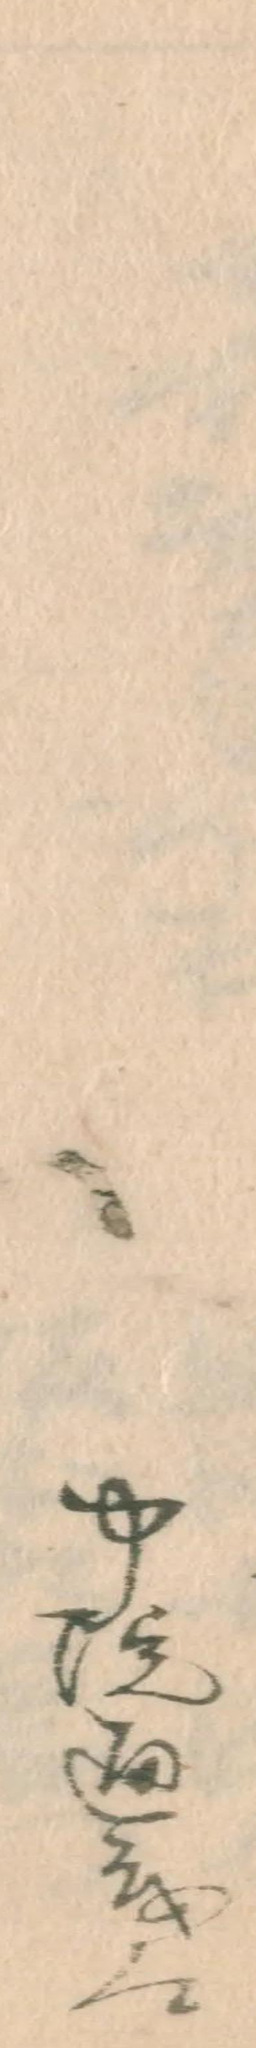中院通茂卿
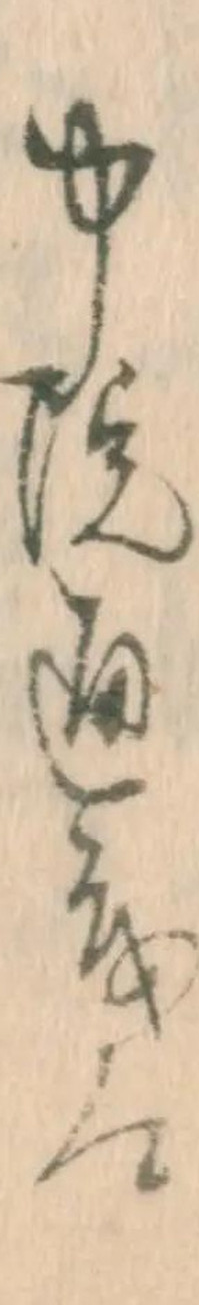中院通茂卿
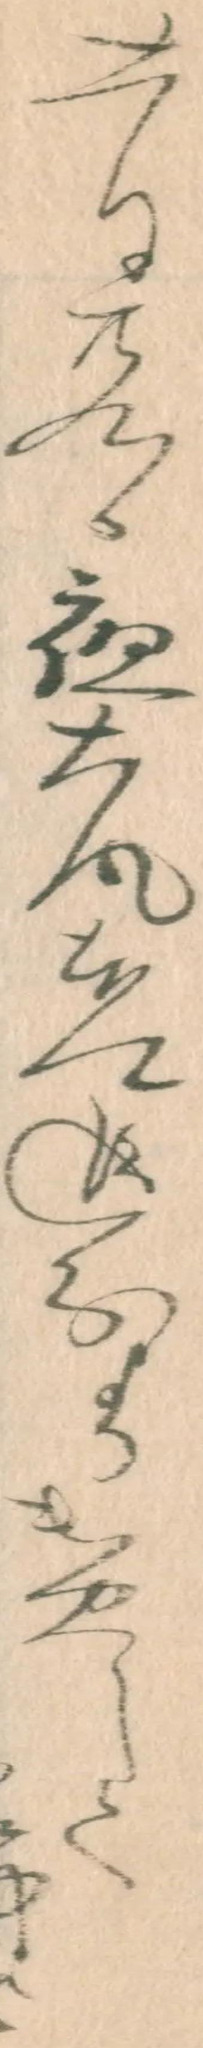十一月廿九日夜大風本郷追分より出火して谷中迄
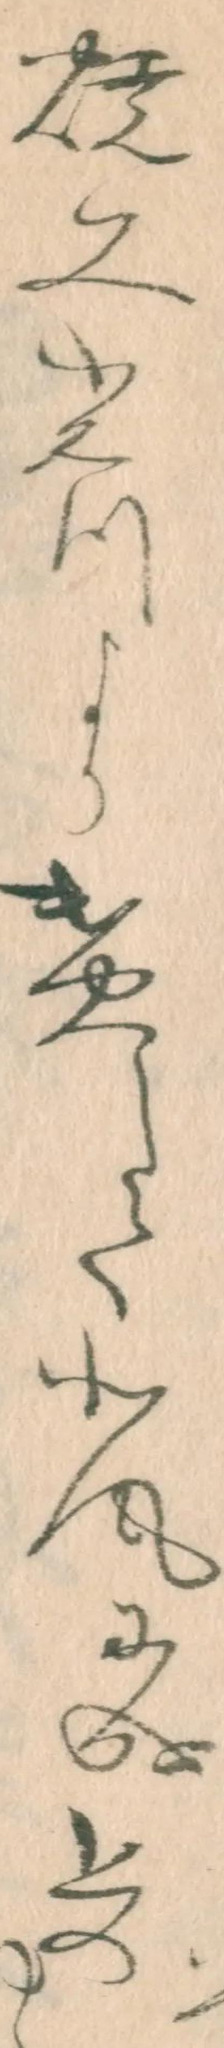焼又小石川より出火して北風に成上のゆしま
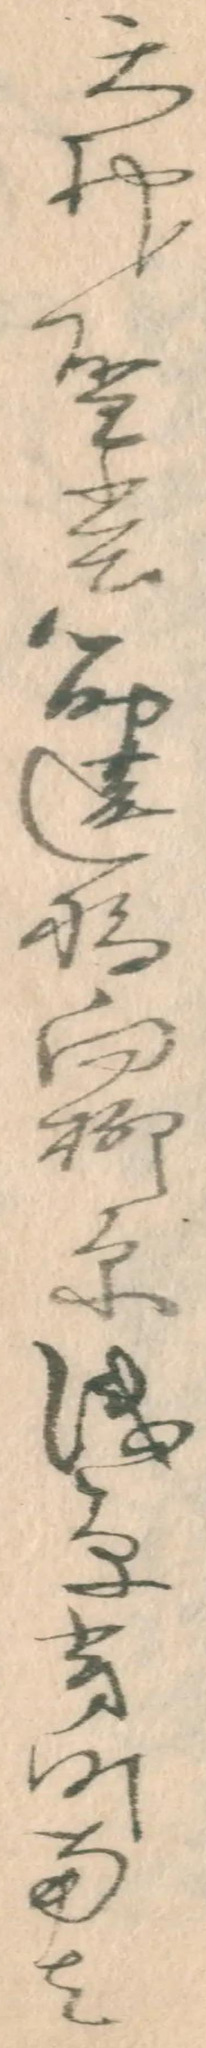天神聖堂筋違橋向柳原浅草茅町南は
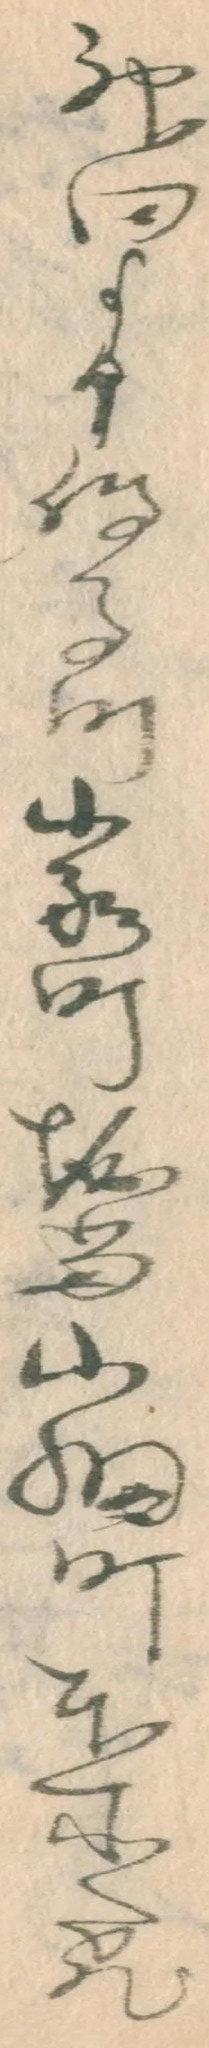神田より伝馬町小泉町堀留小網町本所へ飛

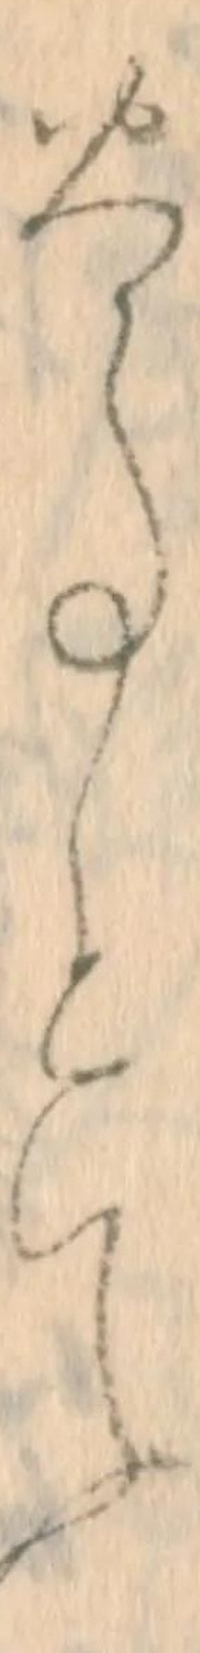火事といふ
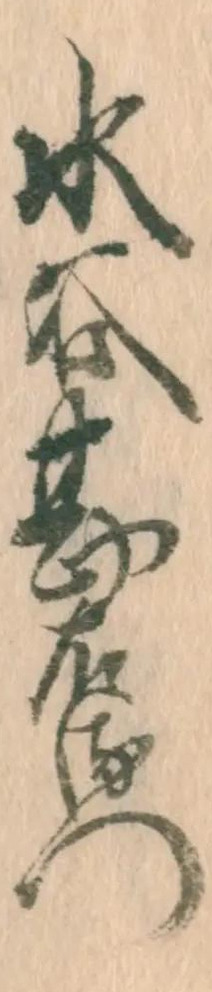水谷甚右衛門
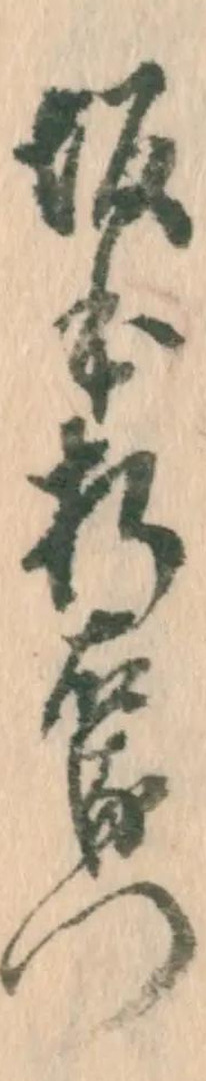坂本折右衛門
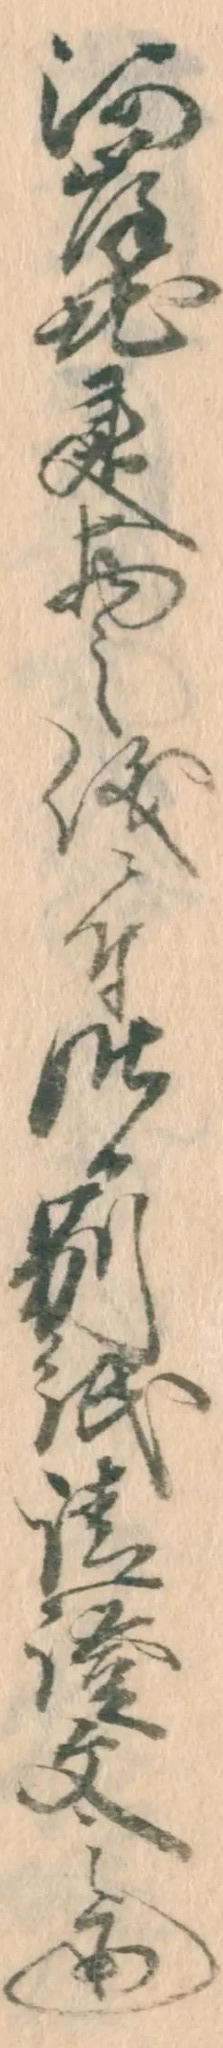河岸地建物之儀ニ付昨日別紙請証文之通
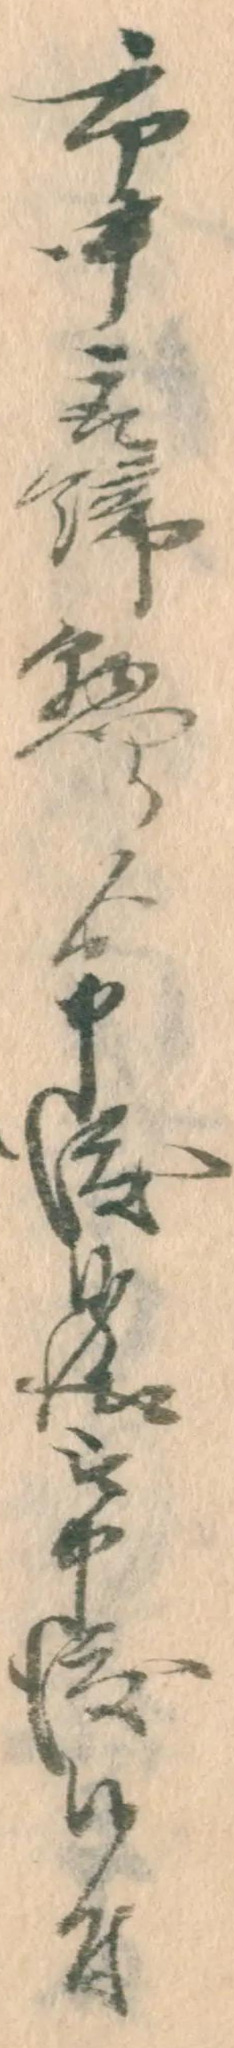市中取締懸リゟ申渡候様被申渡候付

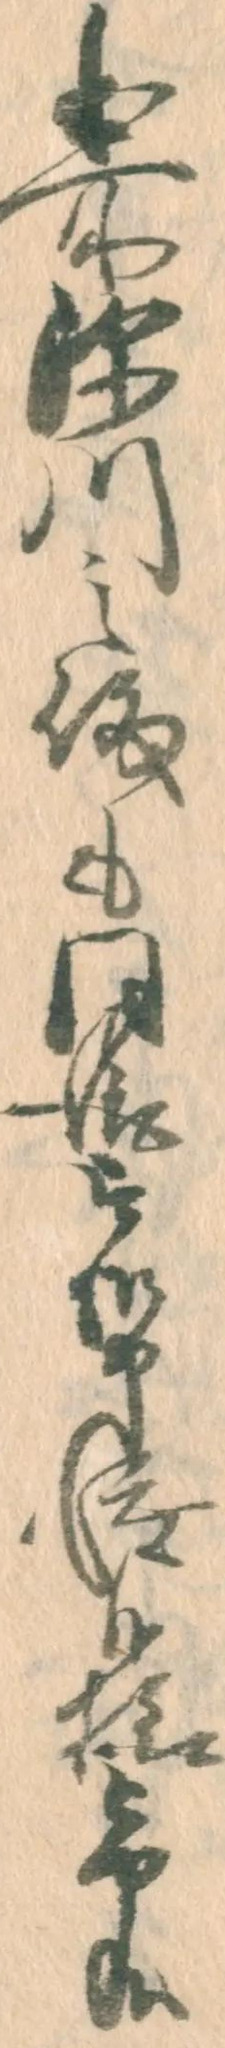本所深川之儀も同様被御申渡候様被申候
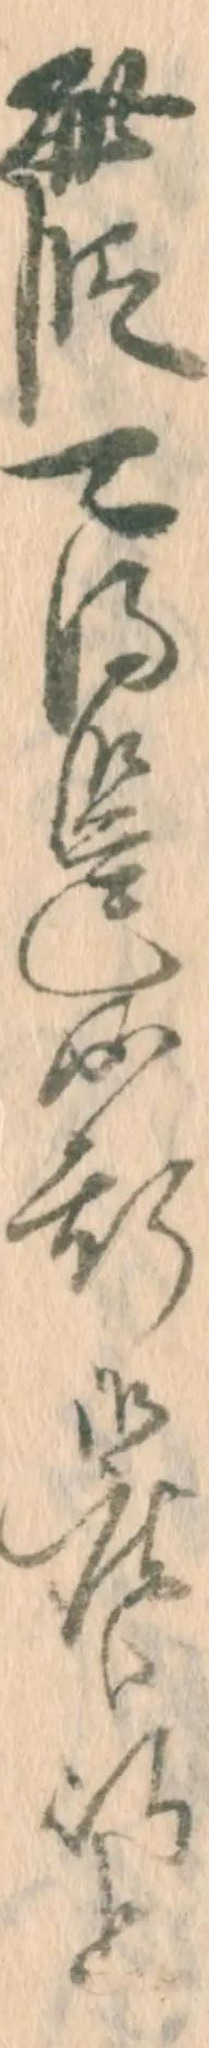此段可得御意如斯御座候以上
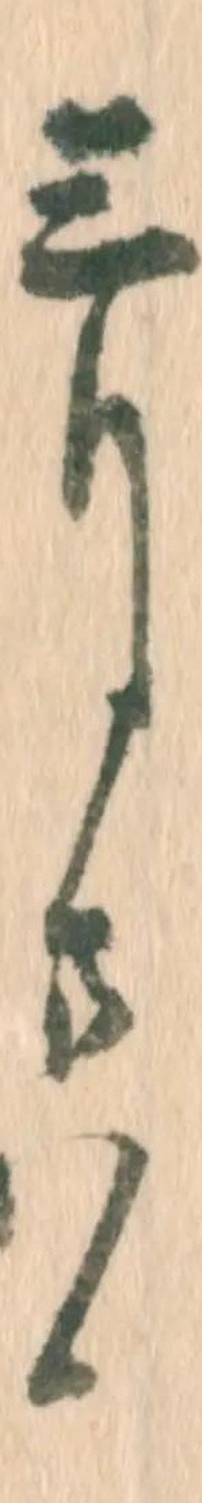三月廿八日
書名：地震災書留 2巻. [1] 内表紙に「地震災書留　安政二卯年　但本所深川御用屋敷地代免除調」とあり
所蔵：国立国会図書館 National Diet Library, JAPAN
